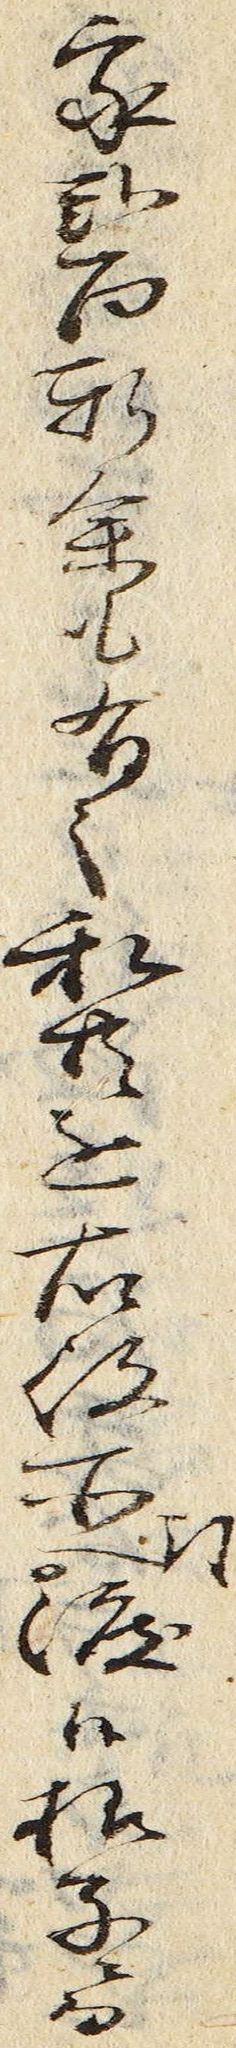家弐百軒余も有之私共を右役所へ引渡候様子にて
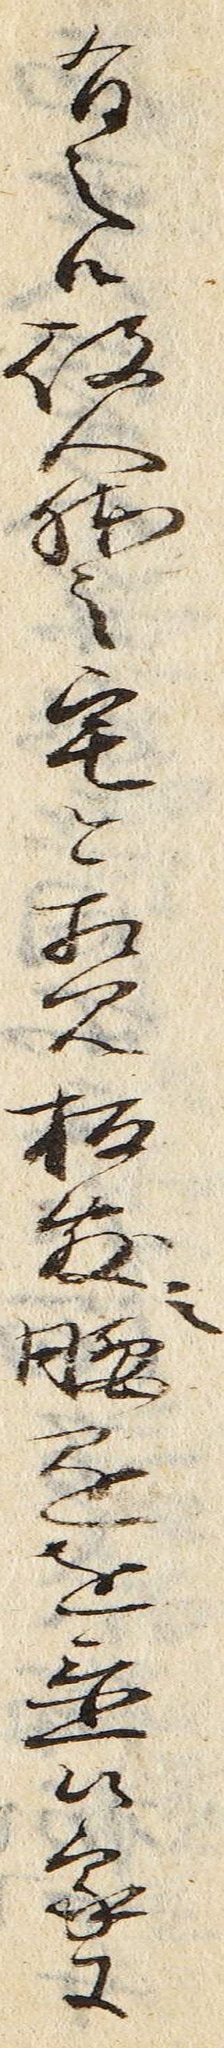有之候役人体之宅と相見板敷之腰懸を置候家に
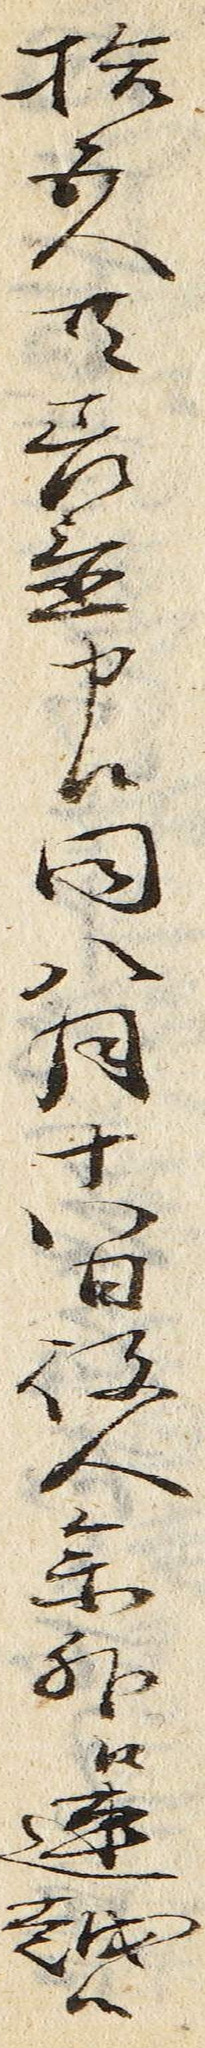拾五人共差置申候同八月十八日役人参外え連越候
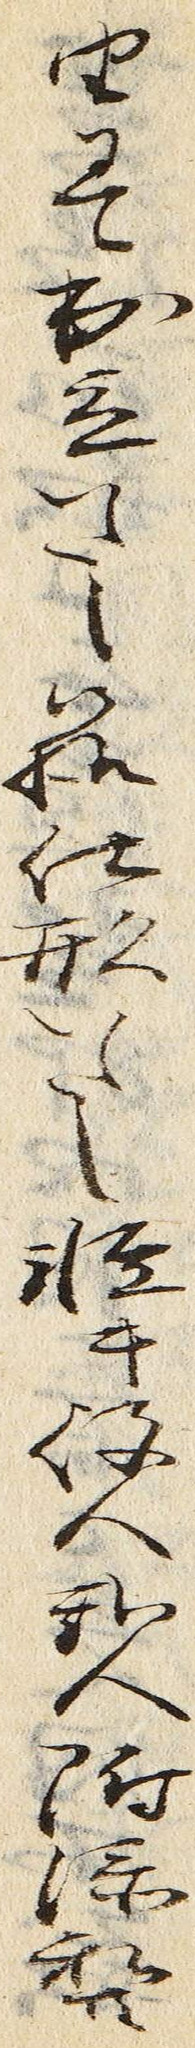由にて出立いたし候様仕形いたし軽キ役人弐人附添私共
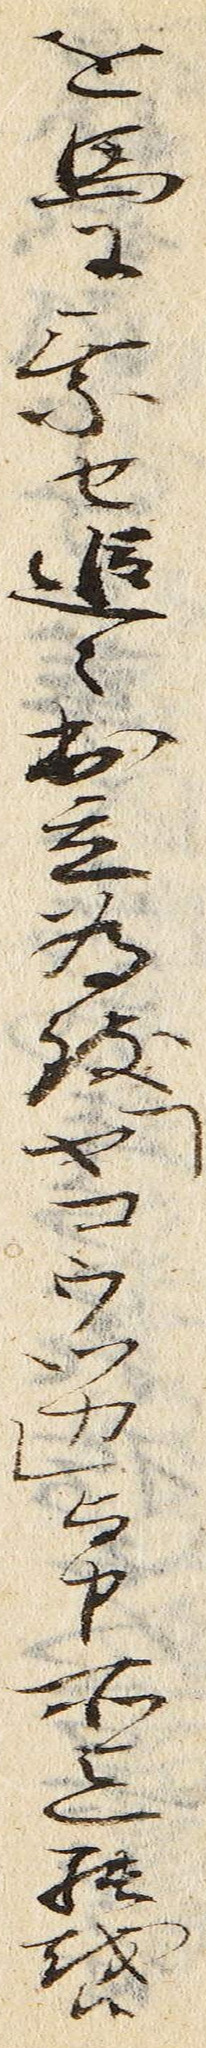を馬に乗せ追々出立為致「ヤコウツカ」と申所迄罷越候
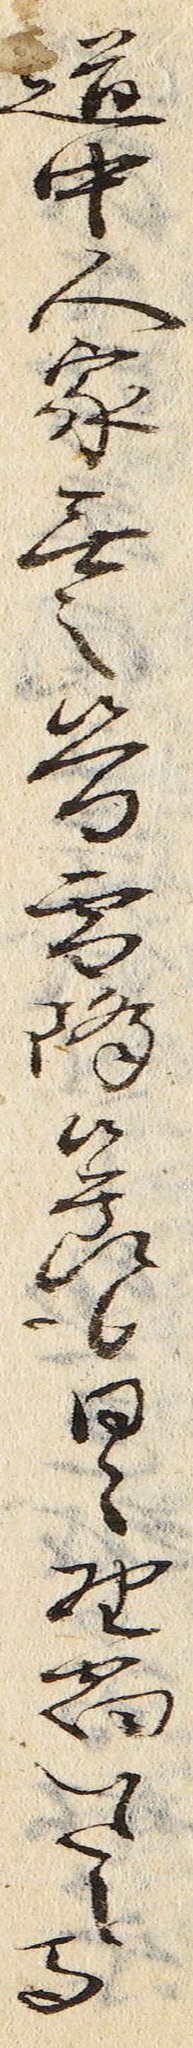道中人家無之候間雪降候節も日々野宿いたし馬
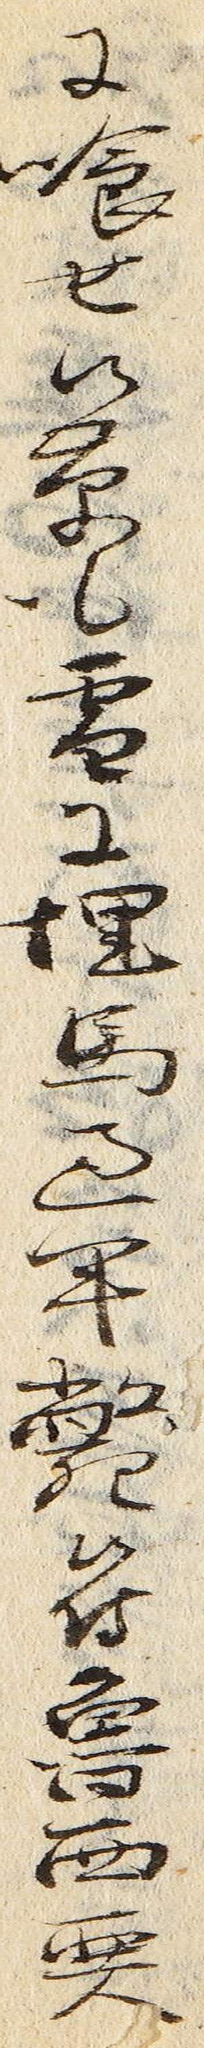に喰せ候草も雪に埋馬過半斃候付魯西亜人
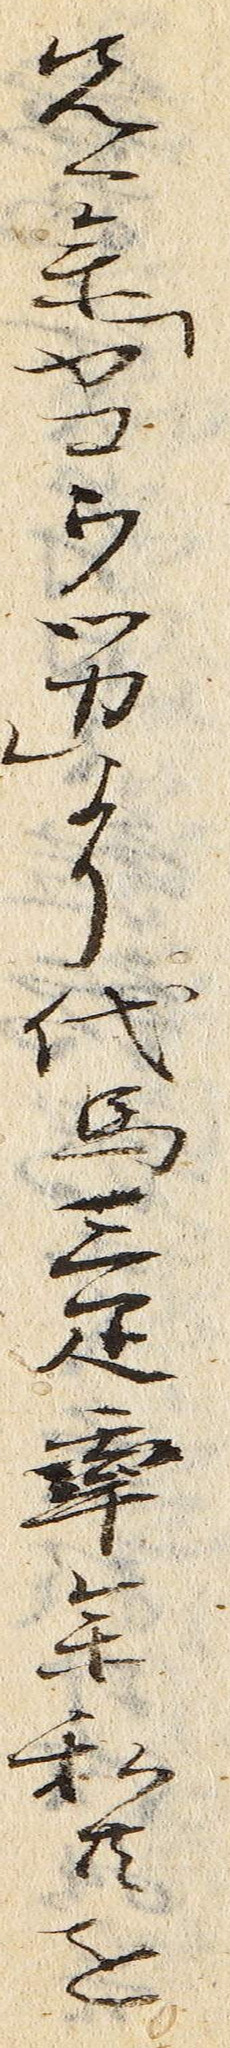先へ参「ヤコウツカ」より代馬三疋牽参私共を
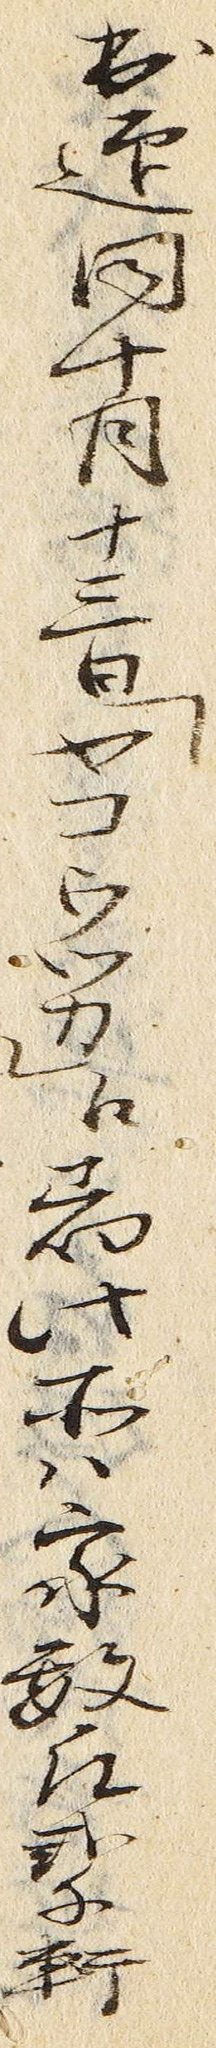出迎同十月十三日「ヤコウツカ」え着此所は家数凡弐千軒
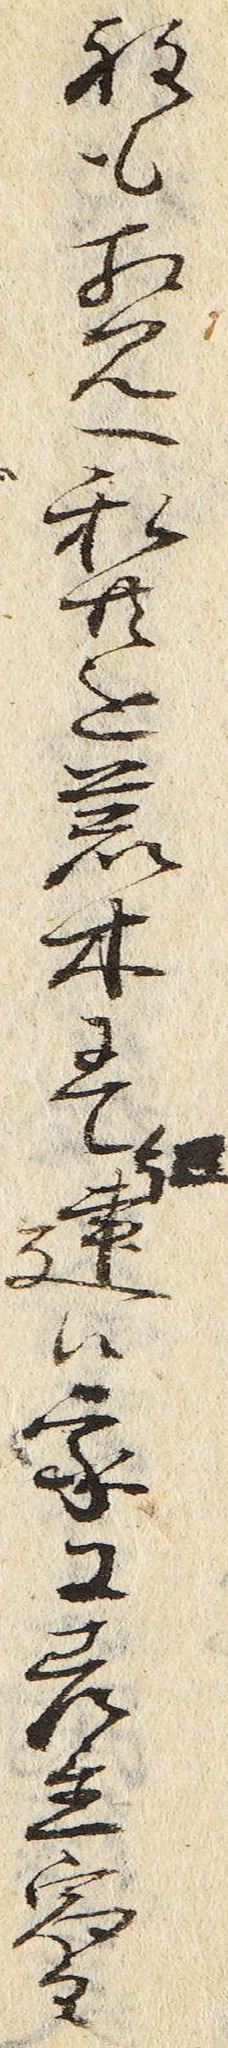程も相見へ私共を荒木にて組建候家に差置宿主
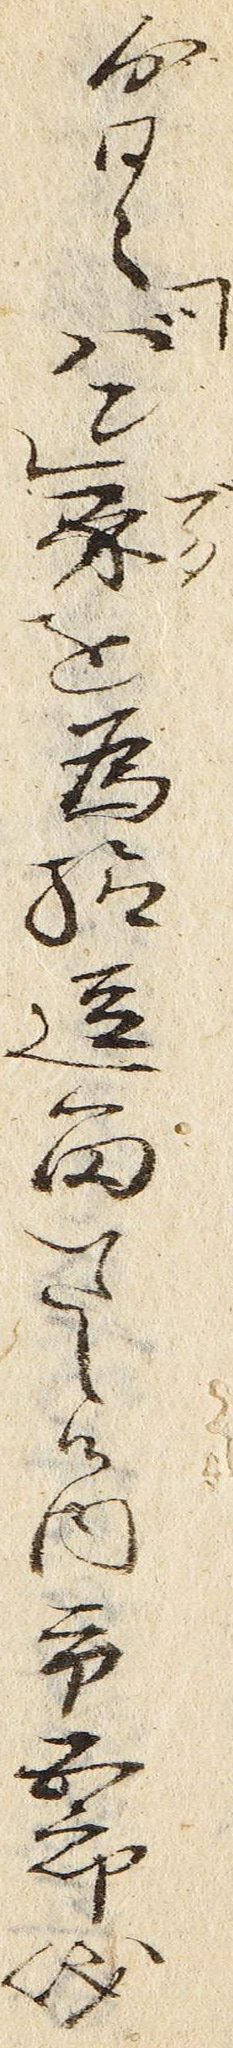ゟ日々「バン」豕を為給逗留いたし候内市五郎儀
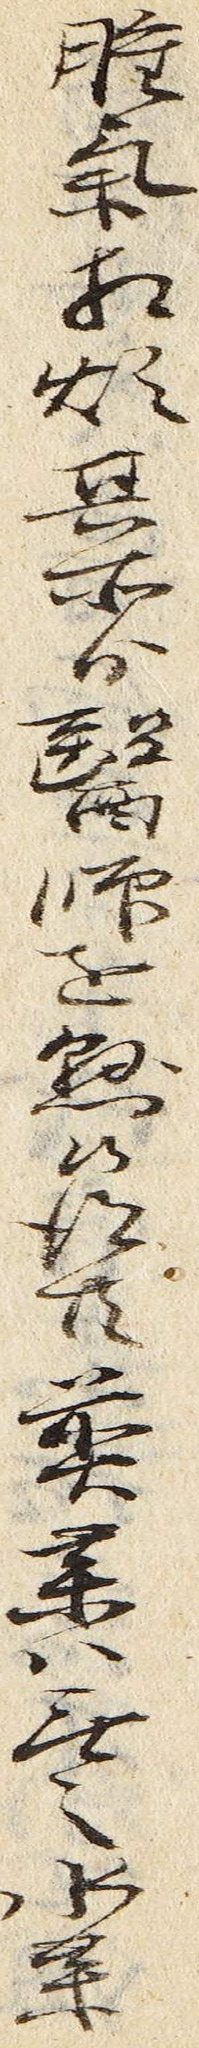腫気相煩其所ゟ医師を懸候得共煎薬は無之水薬
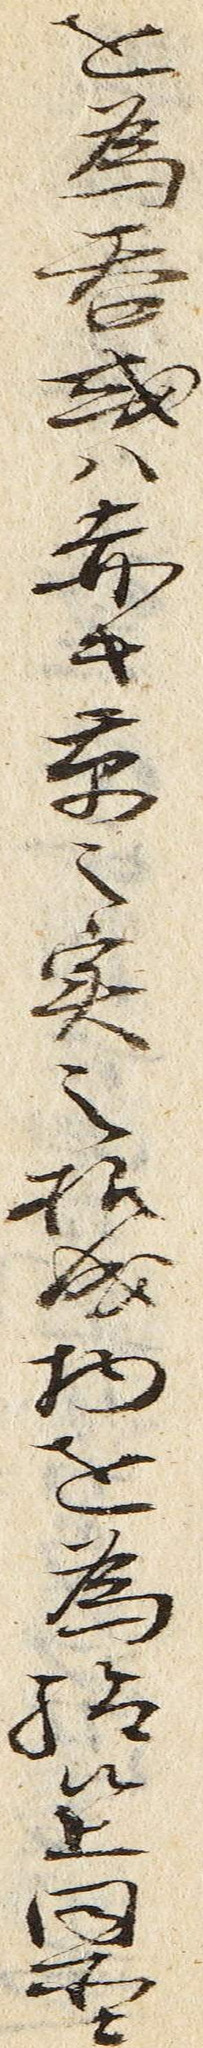を為呑或は赤キ草之実之様成物を為給候上同所に
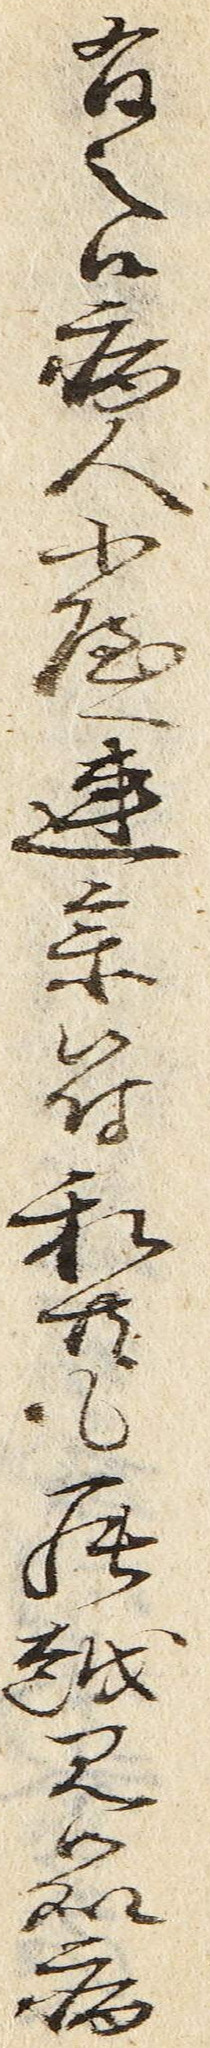有之候病人小屋へ連参候付私共も罷越見候処病
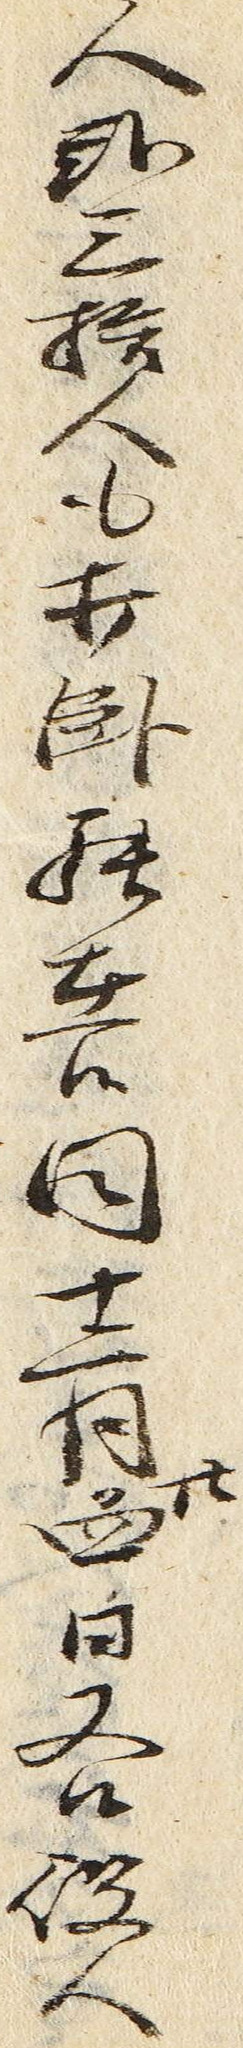人弐三拾人も打臥罷在候同十二月廿四日又候役人
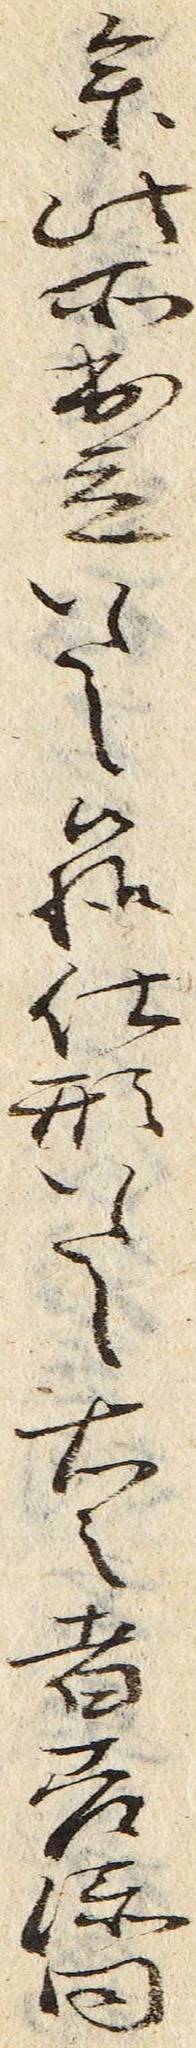参此所出立いたし候様仕形いたし右之者差添同
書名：漂民後記
